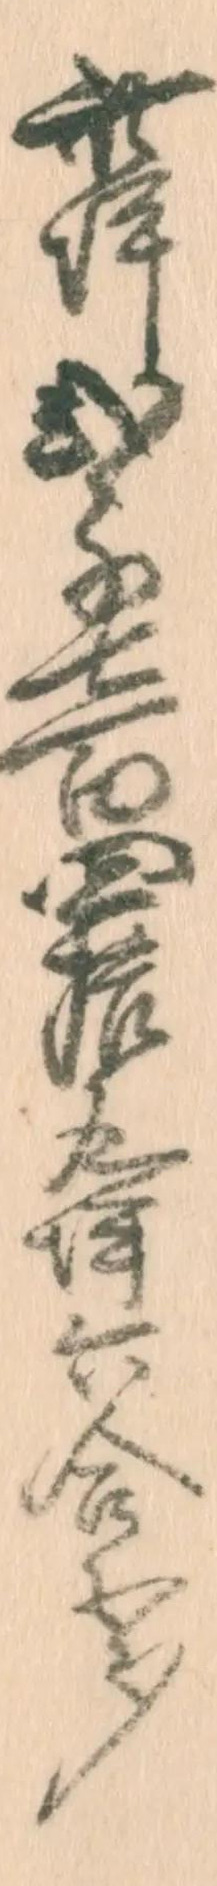此坪弐千七百四拾九坪六合五勺
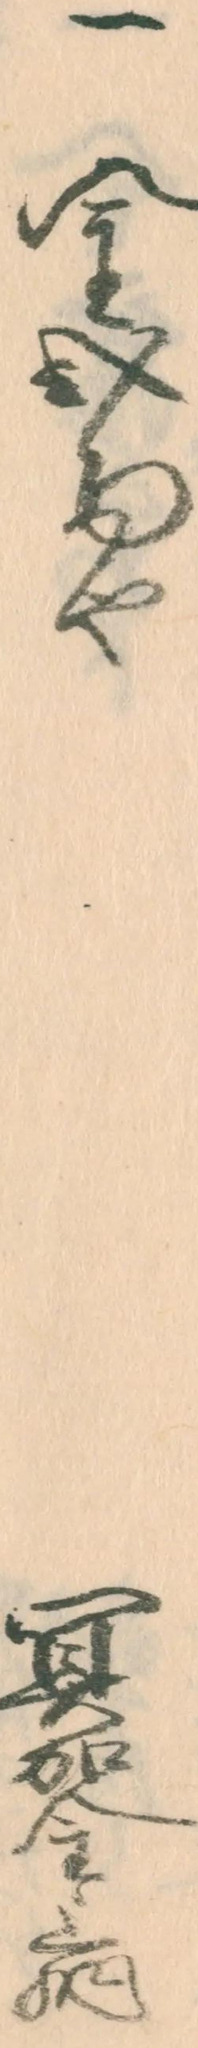一金弐両也冥加金上納

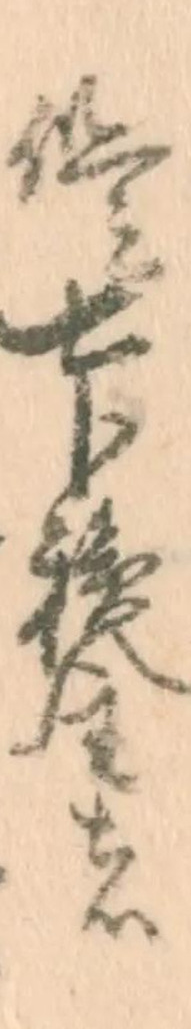但シ七歩積金は
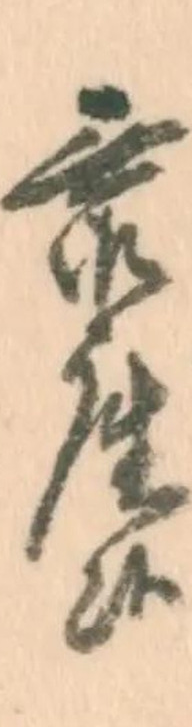無御座候
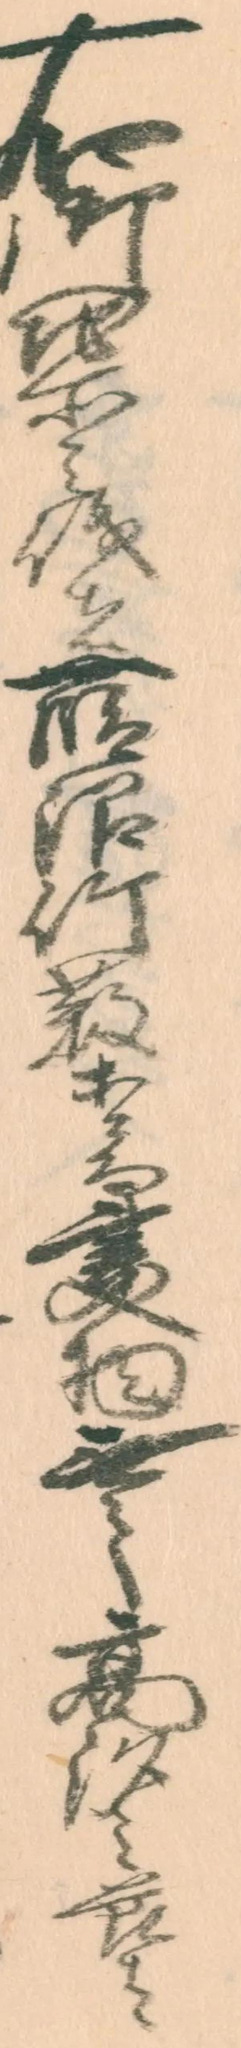右御地所之儀は葭沼竹藪等ニ而建物無之高汐之節は
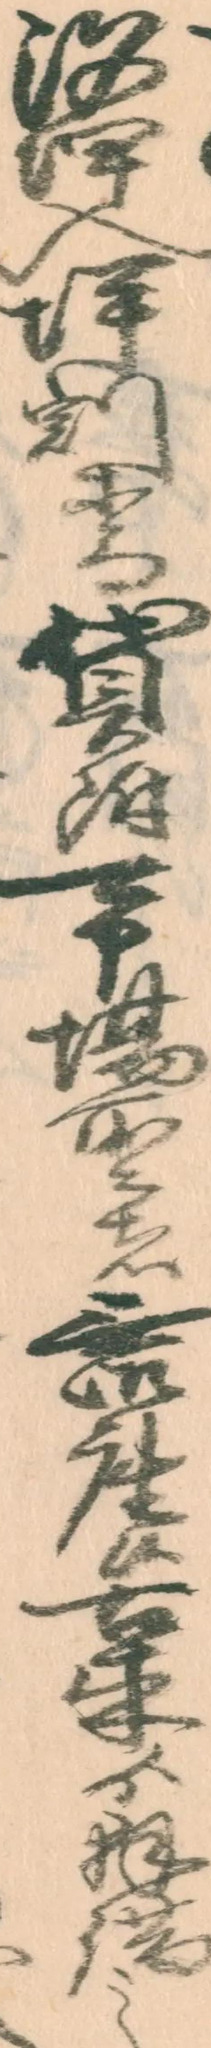汐押入坪割等ニ而貸附可申場所ニは無御座候古来ゟ拝借之
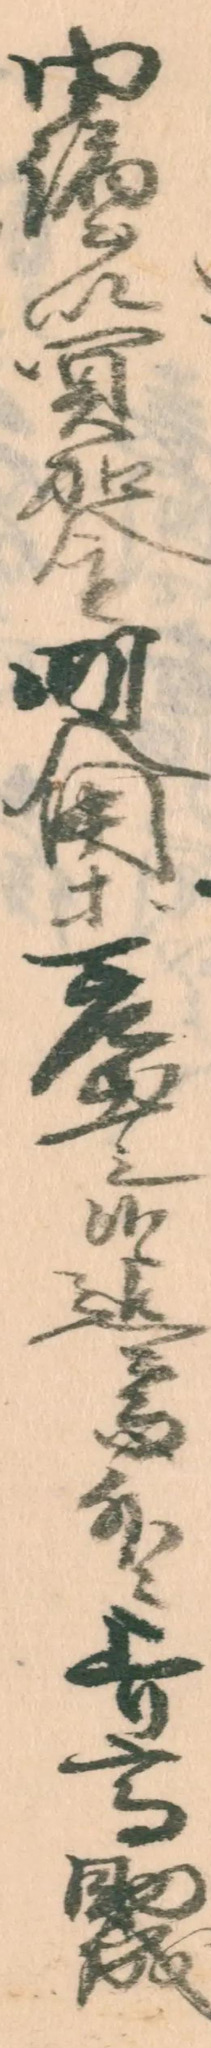由緒ヲ以冥加金町入用等差出シ候迄ニ而外ニ上リ高助成
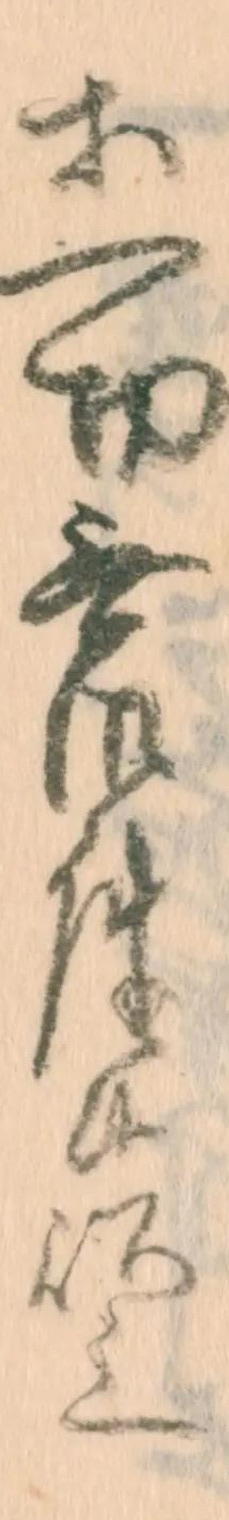等一切無御座候以上
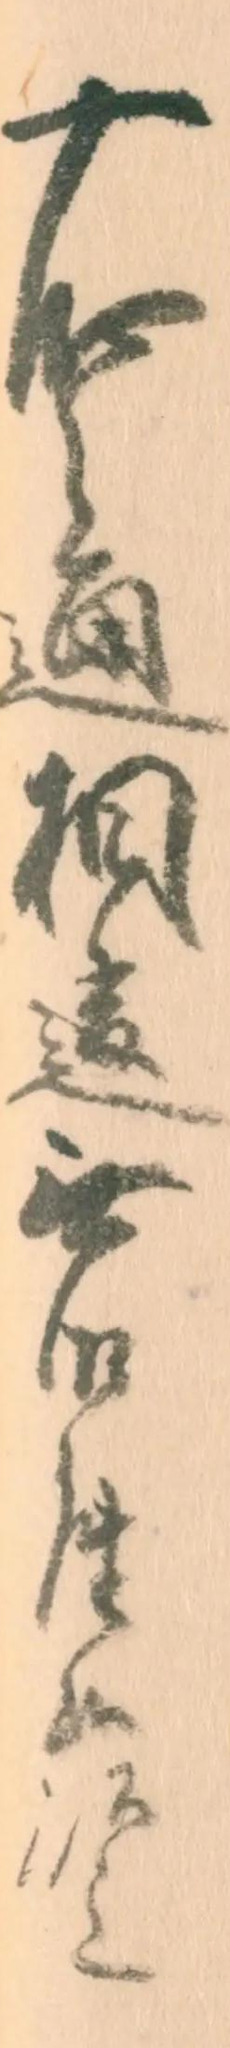右之通相違無御座候以上
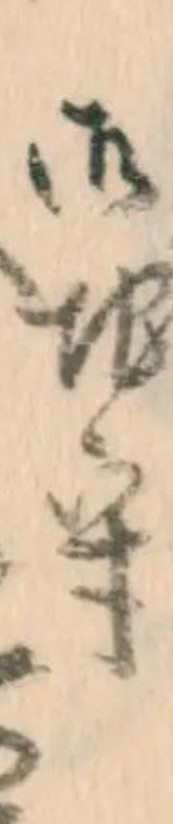御地守

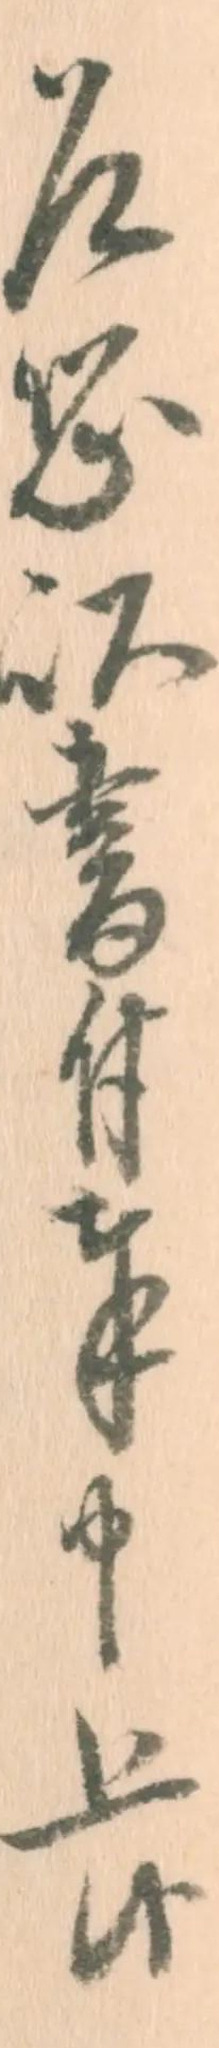乍恐以書付奉申上候
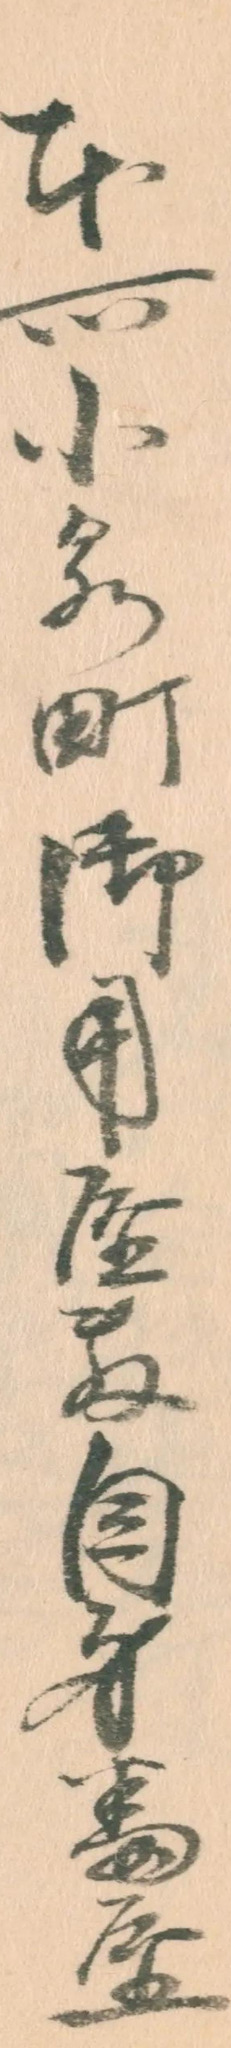一本所小泉町御用屋敷自身番屋
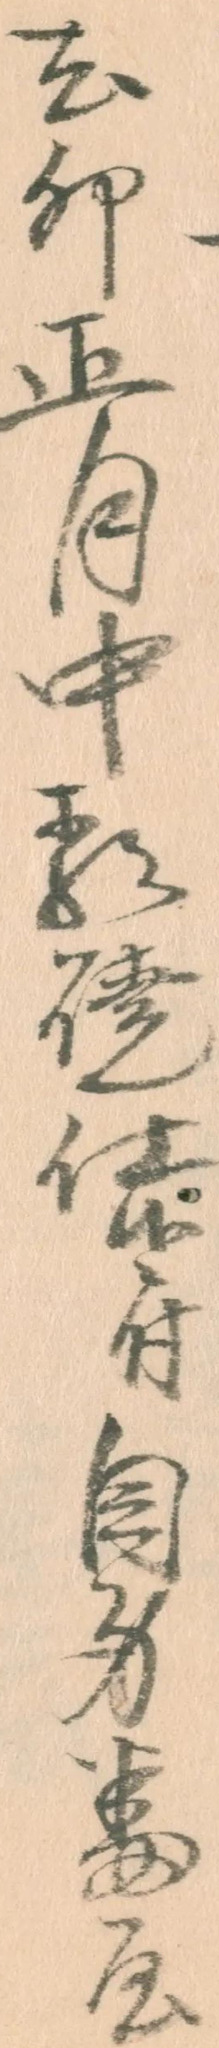去卯正月中類焼仕候ニ付自身番屋
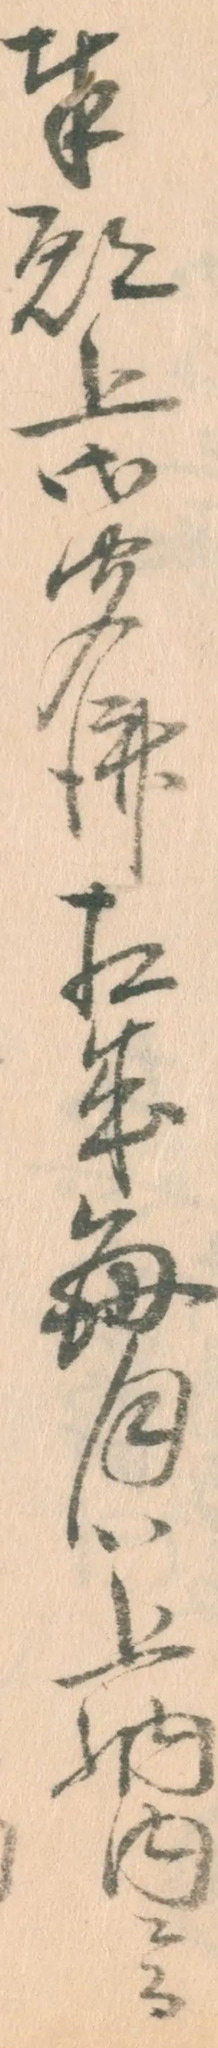奉願上御聞済相成毎月御上納内ニ而
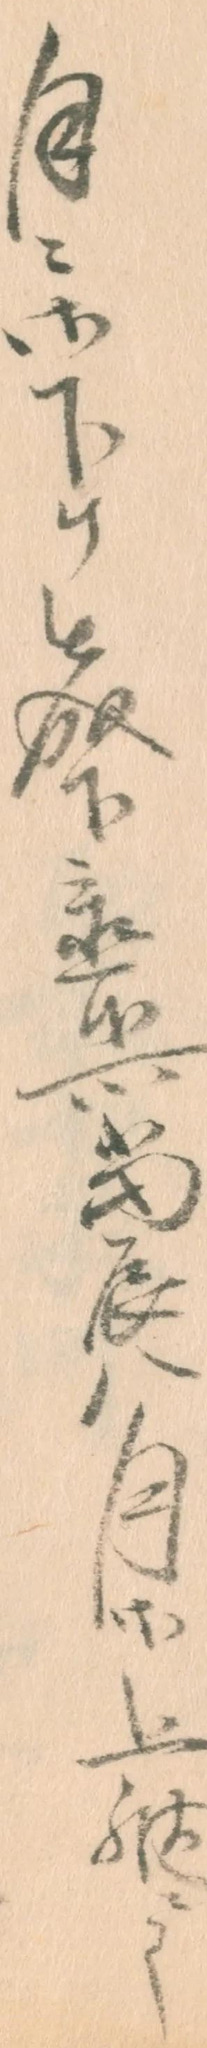月〻御下ヶ被成下置候所当辰八月御上納ニて
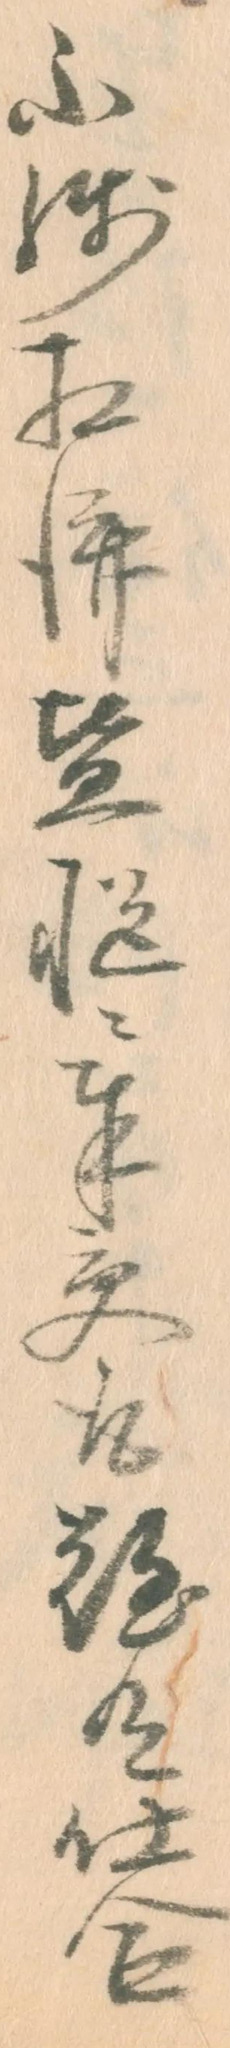不残相済皆慥ニ奉受取難有仕合
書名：地震災書留 2巻. [1] 内表紙に「地震災書留　安政二卯年　但本所深川御用屋敷地代免除調」とあり
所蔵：国立国会図書館 National Diet Library, JAPAN
